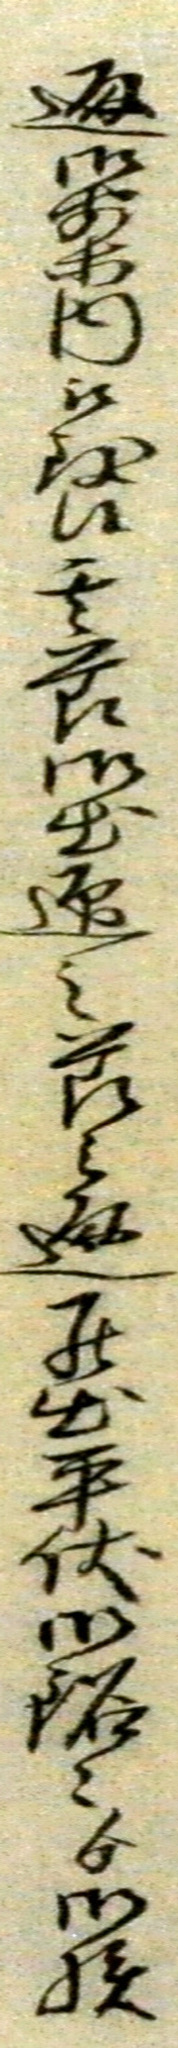通御案内被致候其節御出迎之節之通罷出平伏御銘々ゟ御挨
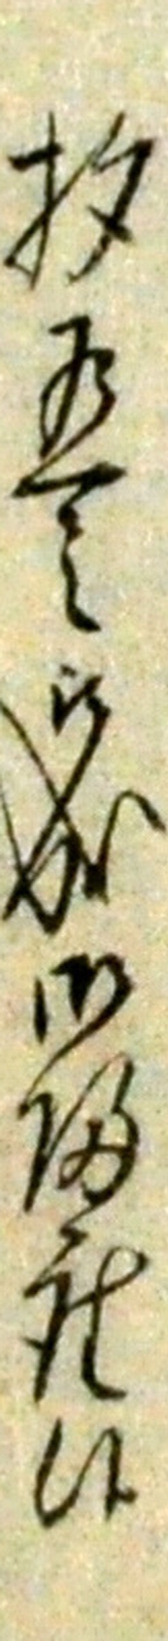拶有之被成御帰座候
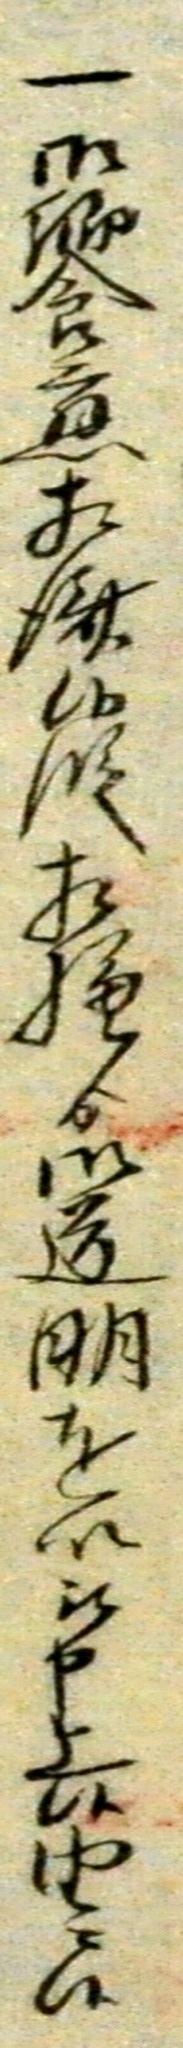一御饗應相済候段相模ゟ御道明を以被申上候由ニ候
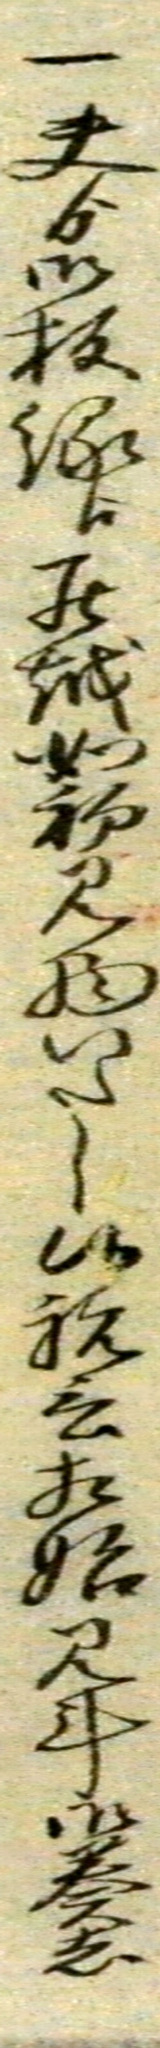一夫ゟ御板縁え罷越如初見物いたし候祝言相始見計御奏者
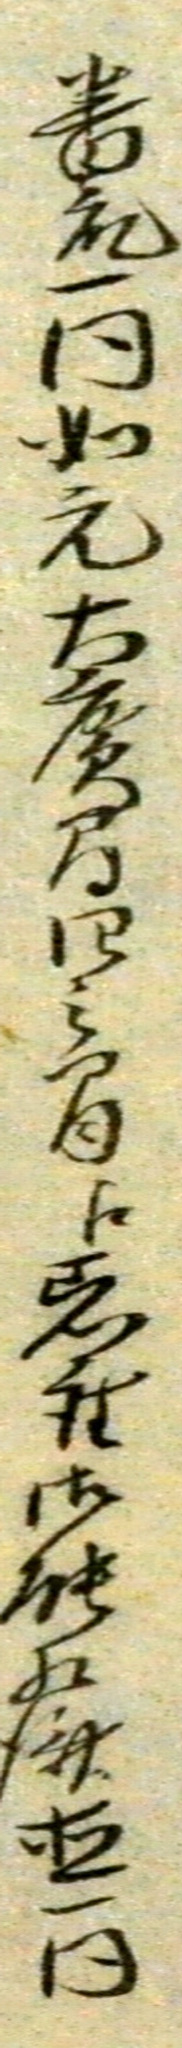番衆一同如元大廣間四之間え着座御能相済直一同
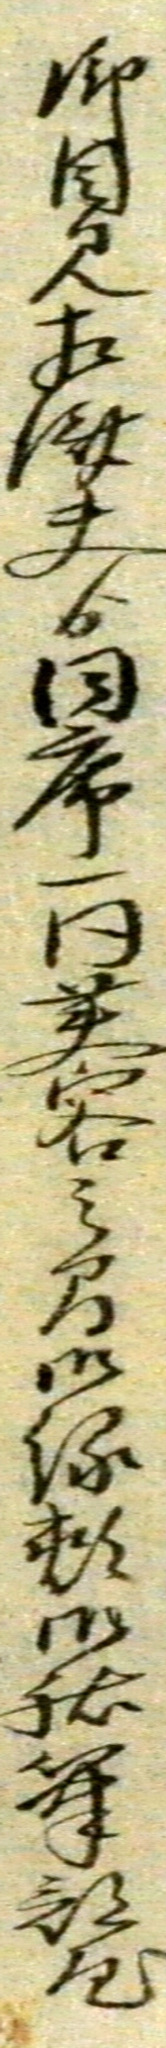御目見相済夫ゟ同席一同芙蓉之間御縁頬御祐筆部屋
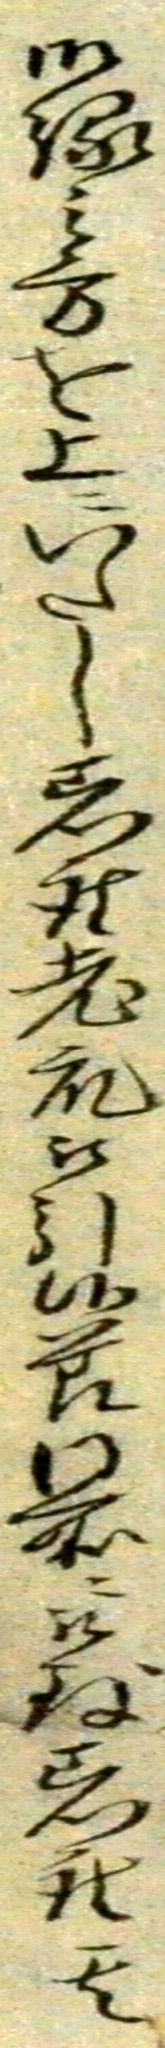御縁之方を上ニいたし着座老衆被引候節同所ニ被致着座其
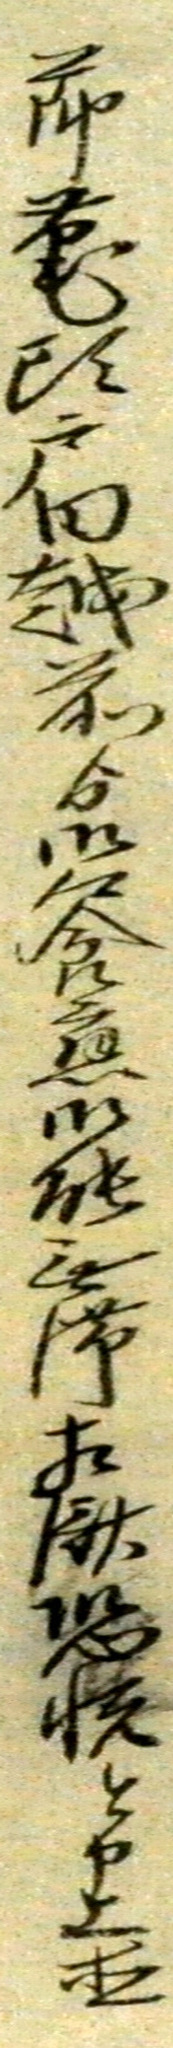節筆頭戸田越前ゟ御饗應御能無滞相済恐悦と申上直
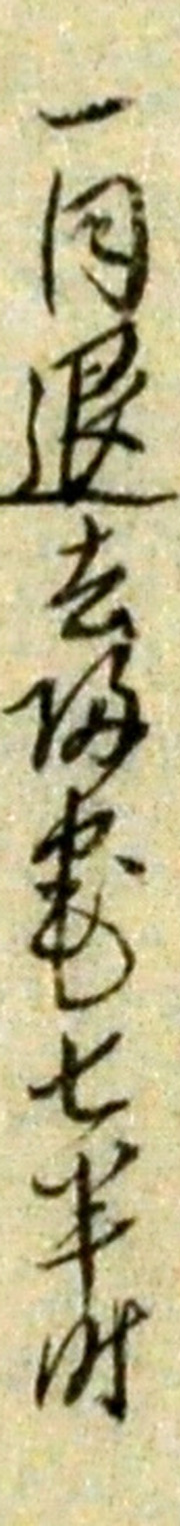一同退去帰宅七半時

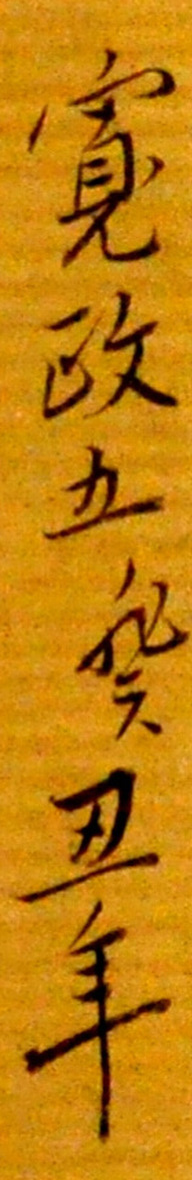寛政五癸丑年
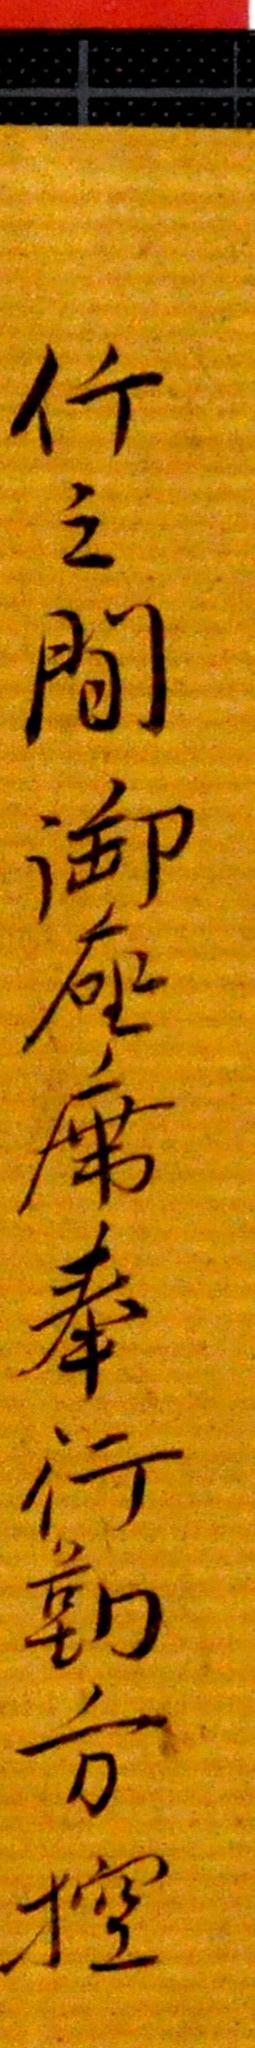竹之間御座席奉行勤方控
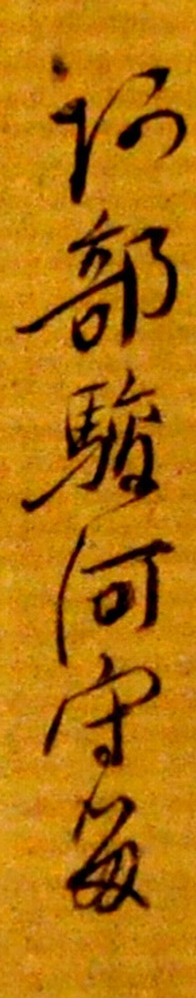阿部駿河守留

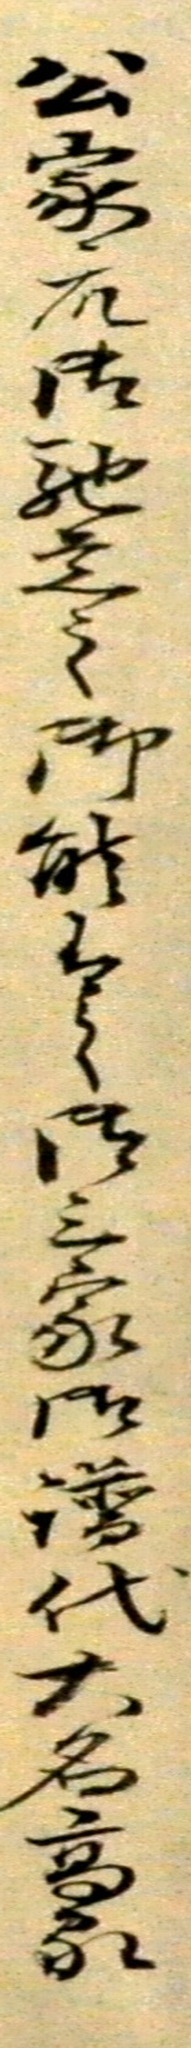公家衆御馳走之御能有之御三家御譜代大名高家
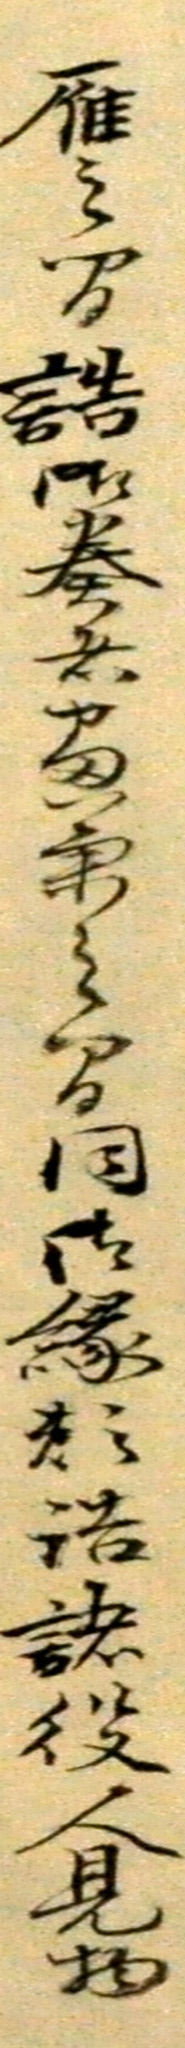雁之間詰御奏者番菊之間同御縁頬詰諸役人見物
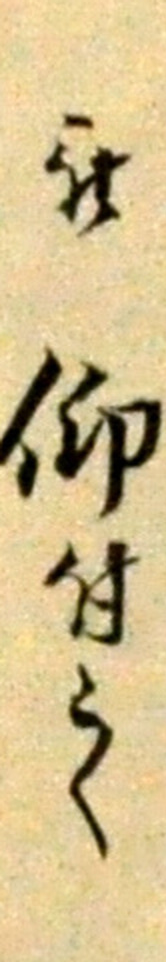被仰付之
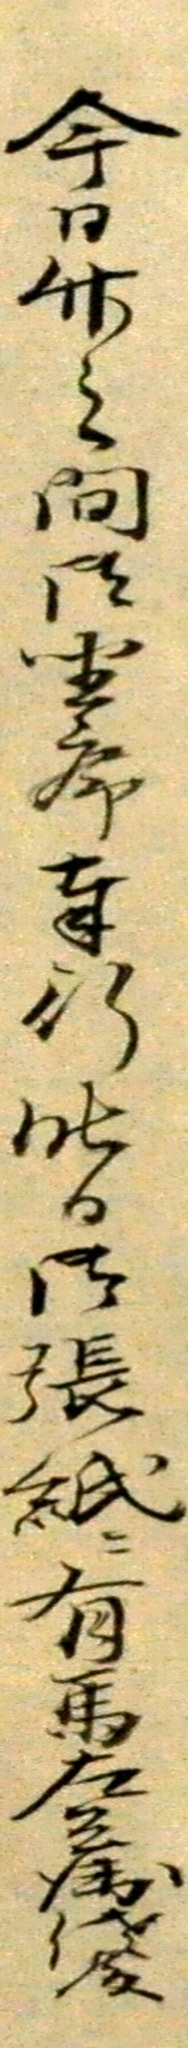一今日竹之間御坐席奉行昨日御張紙ニ有馬左兵衛佐殿
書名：竹ノ間御座席奉行勤方控外
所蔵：伊那市立高遠町図書館・合同会社AMANE
